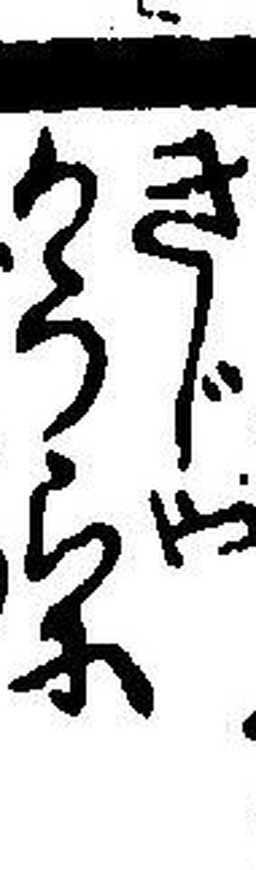かうらに
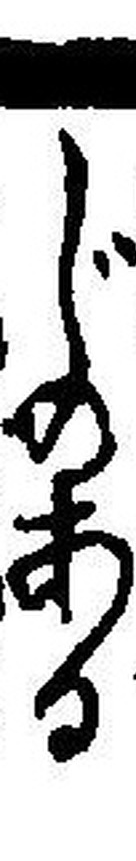じのある
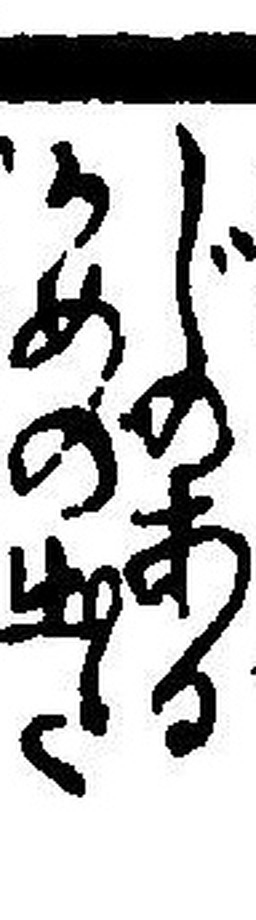かめの出た
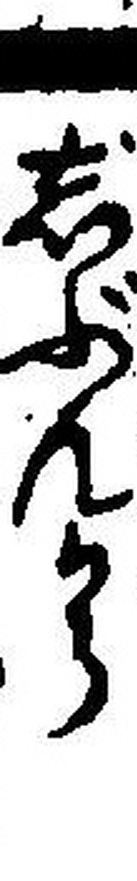じぶんから
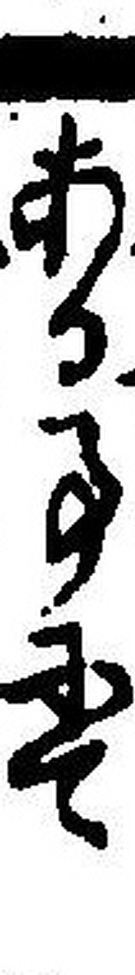ある事にて
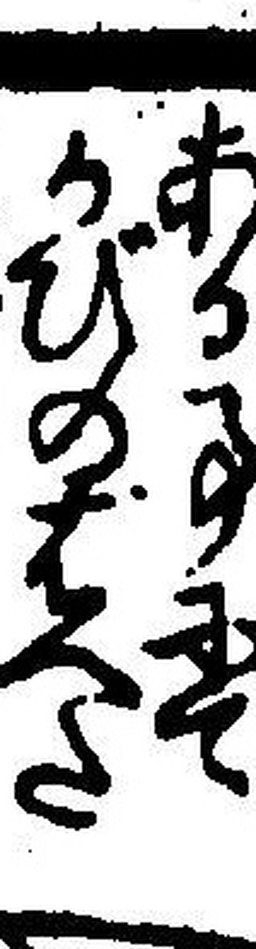かびのはへた
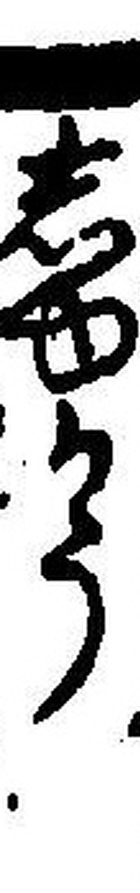しゆかう
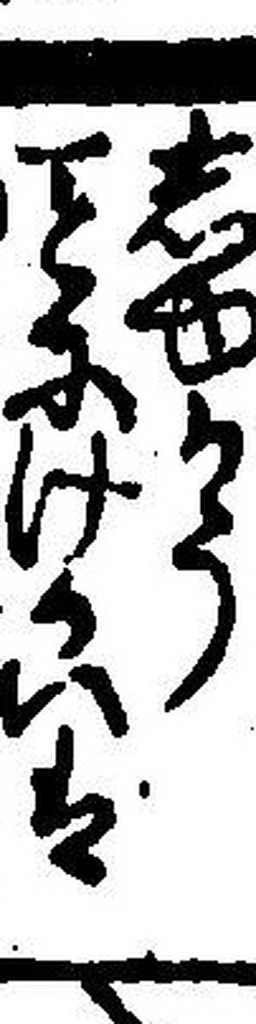ことにけかいは
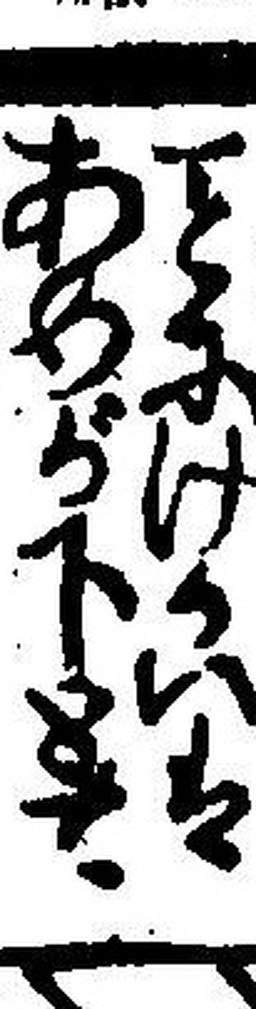あめが下とて
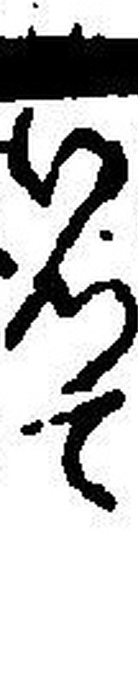いつて
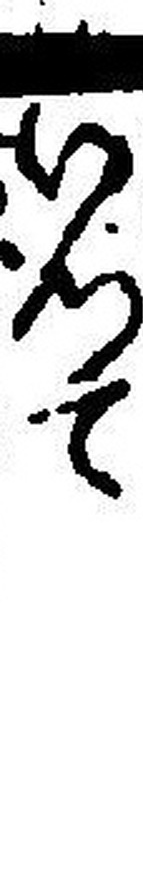いつて
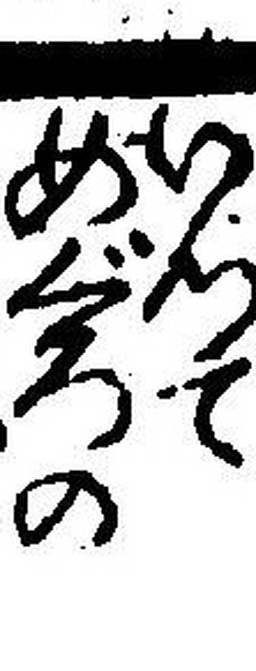めぐろの
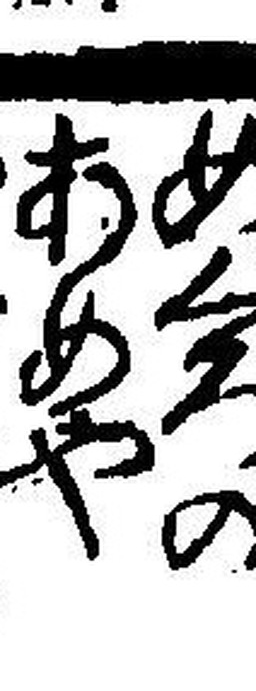あめや
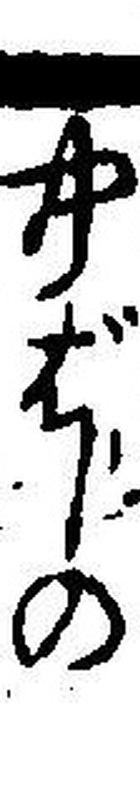中ばしの
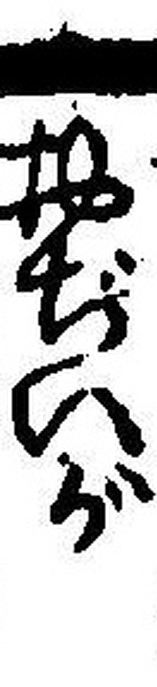おぢいが
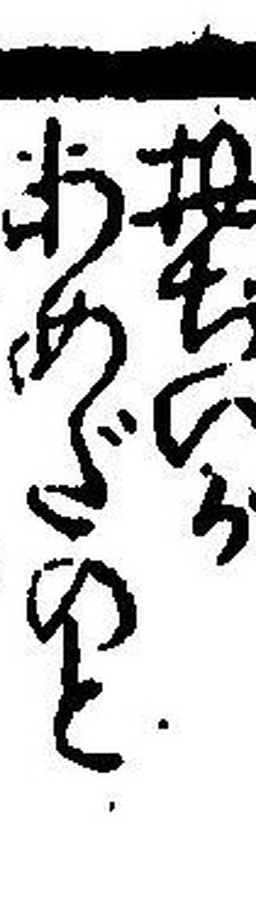あめだのと
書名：徳若水縁起金性 / 樹下石上作
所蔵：東京大学総合図書館 General Library in the University of Tokyo, JAPAN
